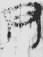尹
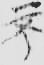不
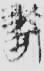敢
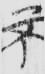不
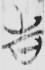告
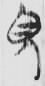視
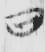日
